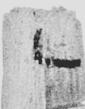也
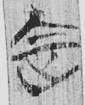定
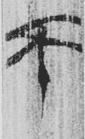不
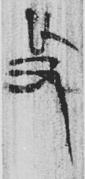及
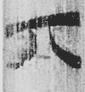亓（其）
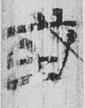城（成）
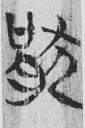○（狷）
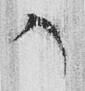人
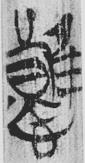戁（難）
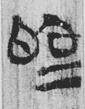爲
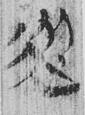從
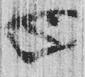正
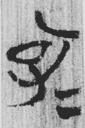孔子
